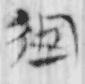○（卜）
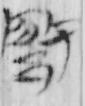○（殷）
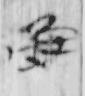○（雘）
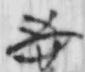志
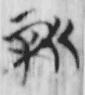新
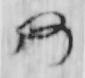尹
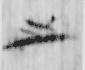之
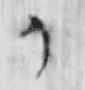人
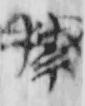○（縢）
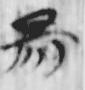昜
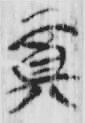奠
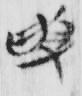受
